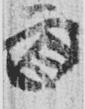百
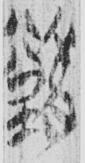○（豫）
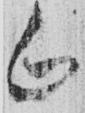㠯（以）
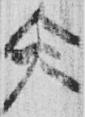內（入）
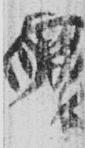○（囚）
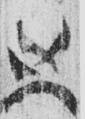之
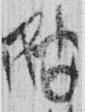姑（苦）
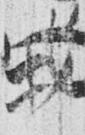○（成）
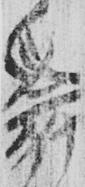○（家）
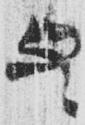父
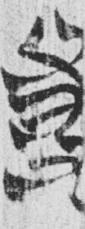尃（捕）
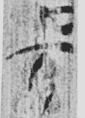長
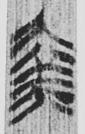魚
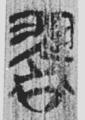翯
